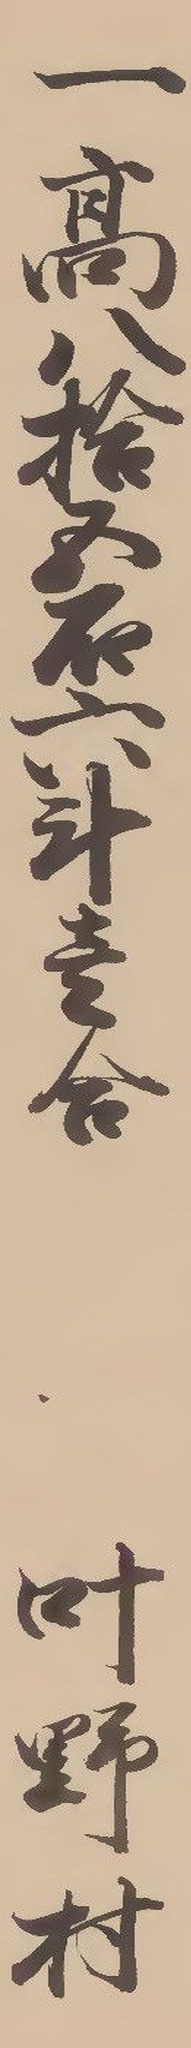一高八拾五石六斗壱合叶野村
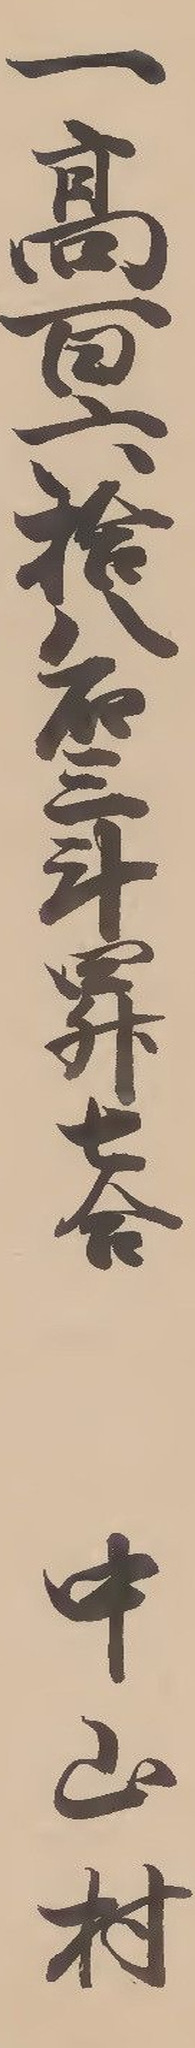一高百六拾八石三斗四升七合中山村
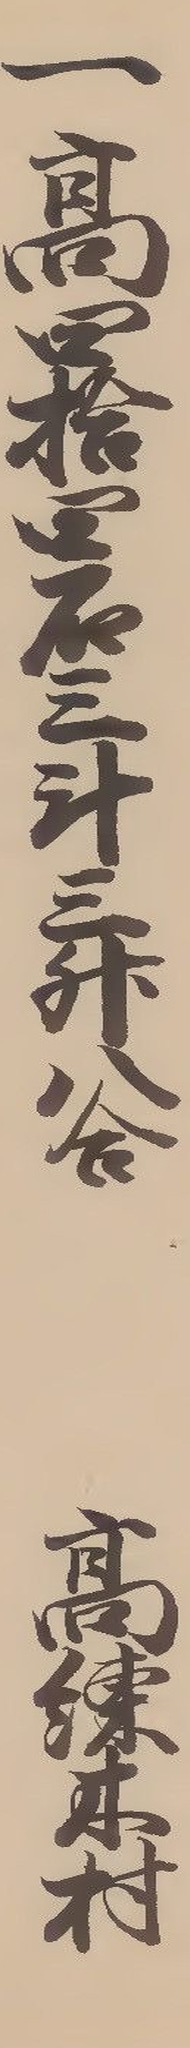一高四拾四石三斗三升八合高練木村
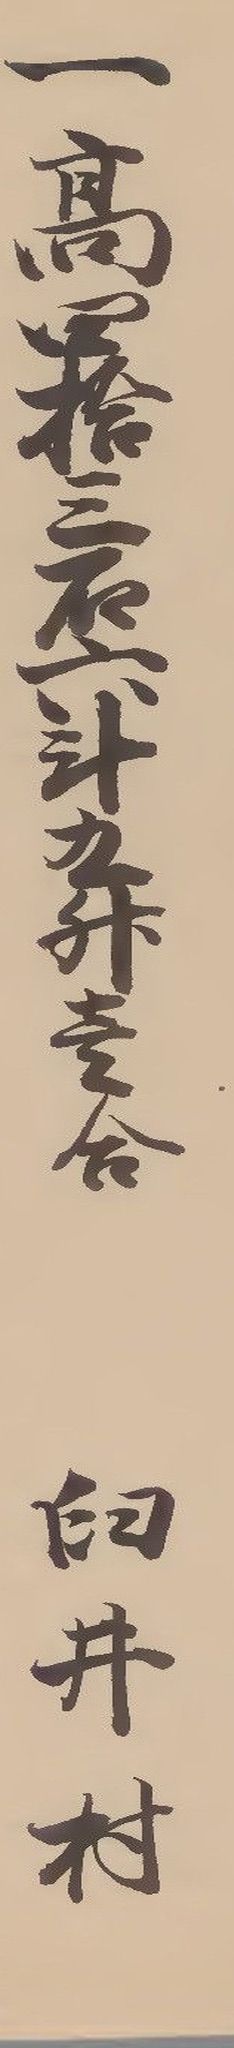一高四拾三石六斗九升壱合臼井村
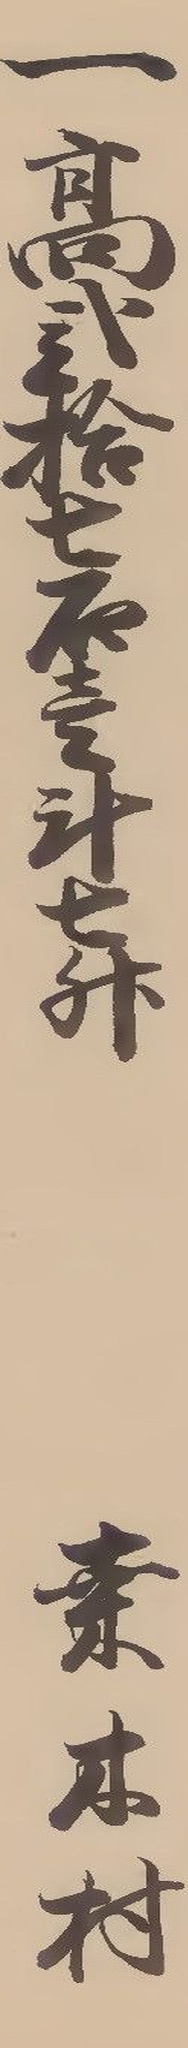一高弐拾七石壱斗七升桑木村

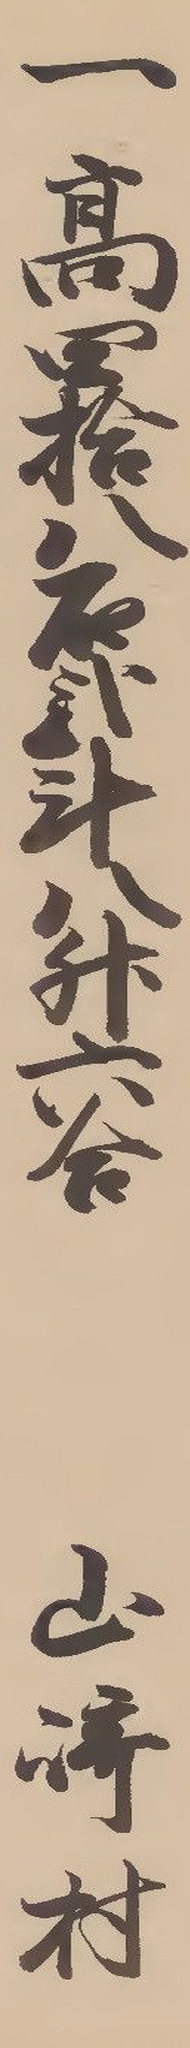一高四拾八石弐斗八升六合山崎村
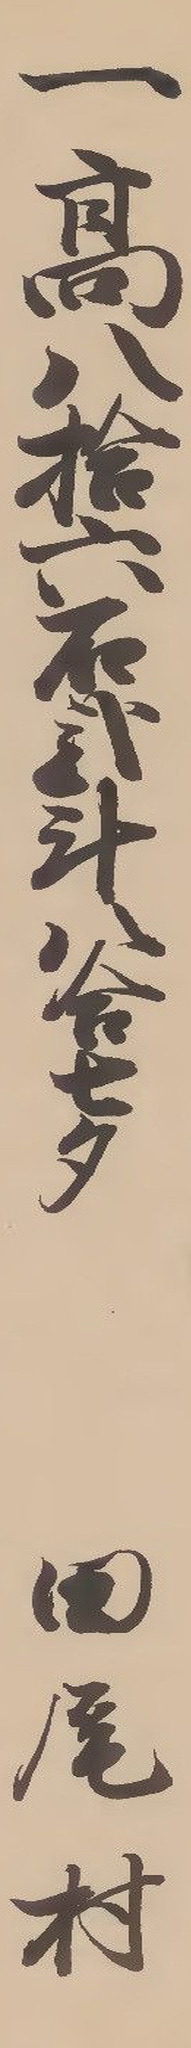一高八拾六石弐斗八合七勺田尾村
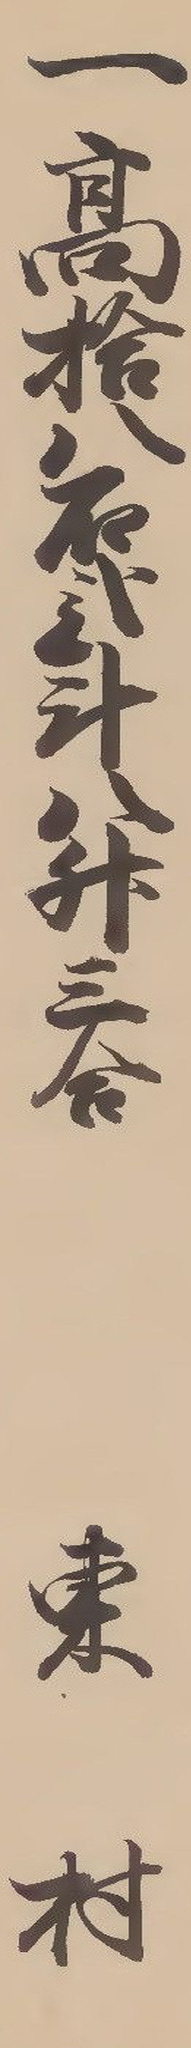一高拾八石弐斗八升三合東村
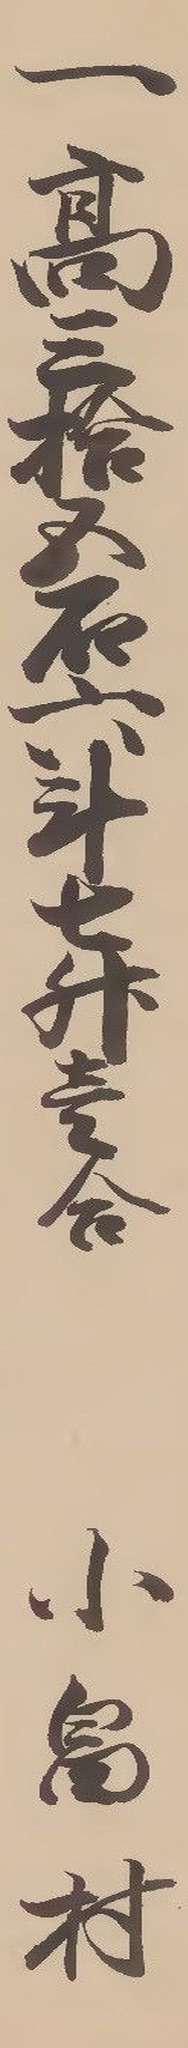一高三拾五石六斗七升壱合小畠村
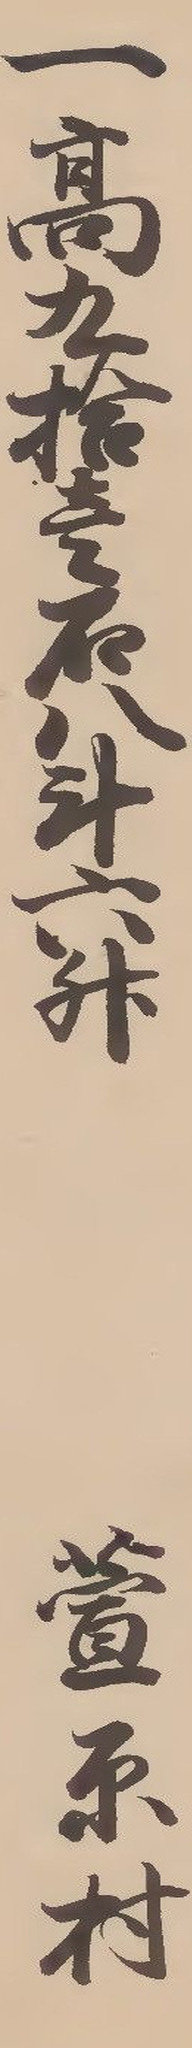一高九拾壱石八斗六升萱原村
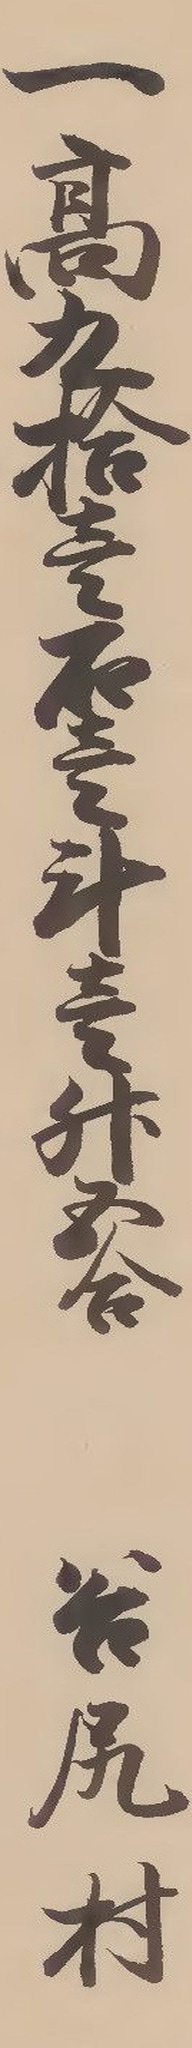一高九拾壱石壱斗壱升五合谷尻村
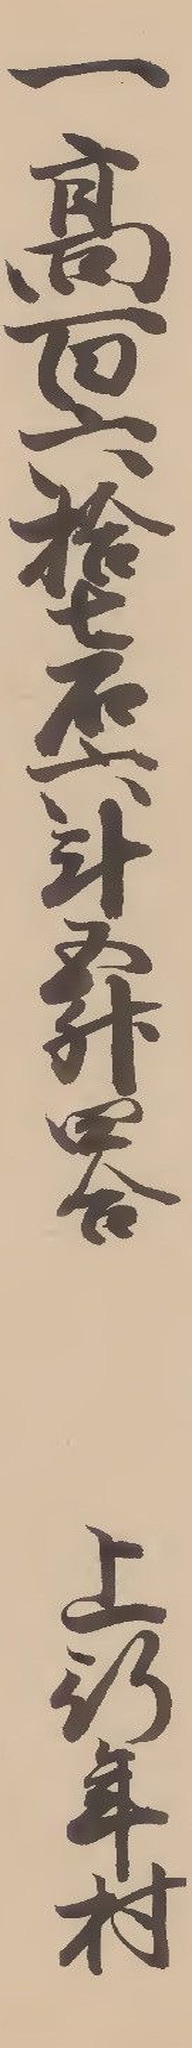一高百六拾七石六斗五升四合上行年村
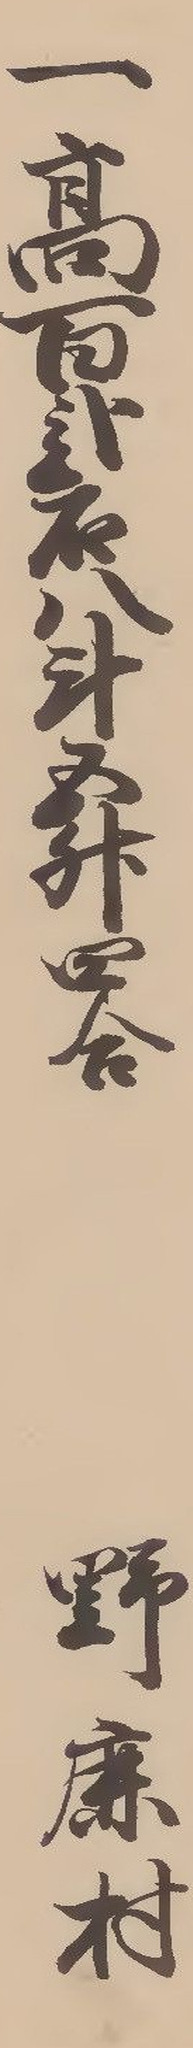一高百弐石八斗五升四合野鹿村

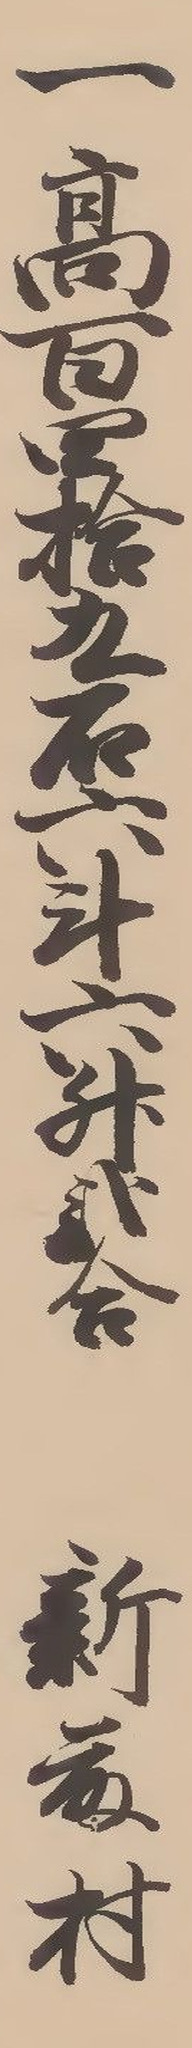一高百四拾九石六斗六升弐合新藤村
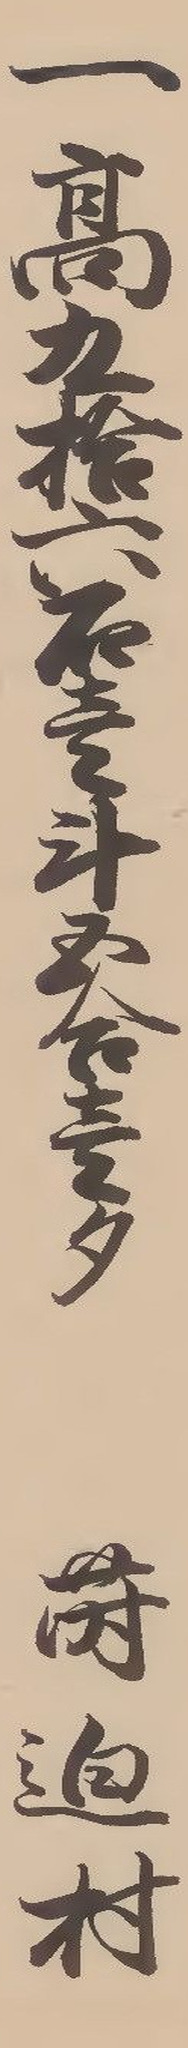一高九拾六石壱斗五合壱勺蒔迫村
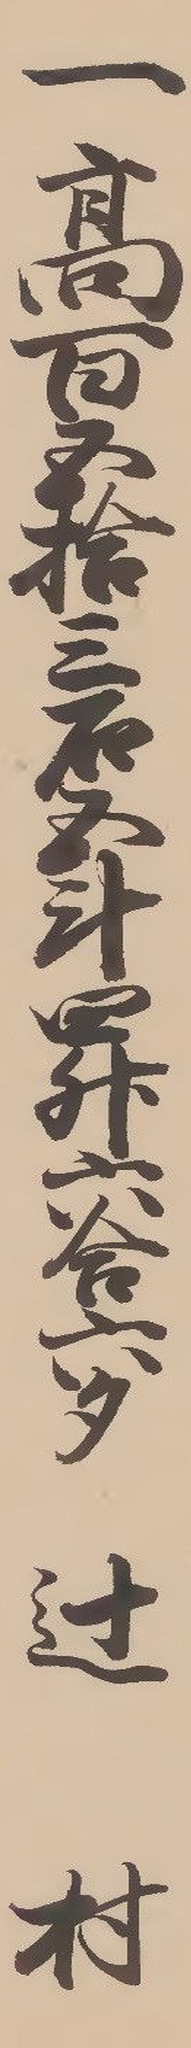一高百五拾三石五斗四升六合六勺辻村
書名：豊後国郷帳
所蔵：国立公文書館 National Archives of Japan
